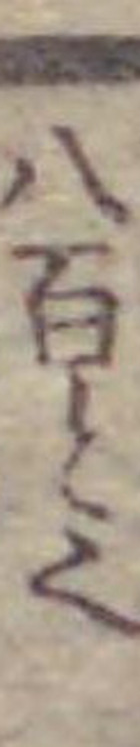八百と也
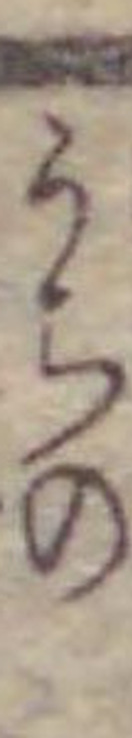うちの
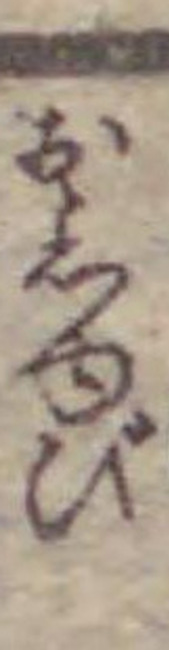おしゆび
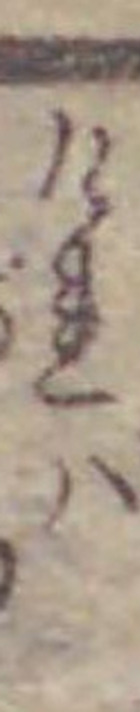ければ
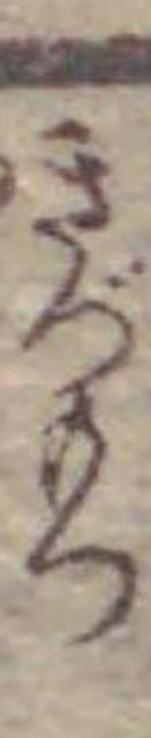きづもつ
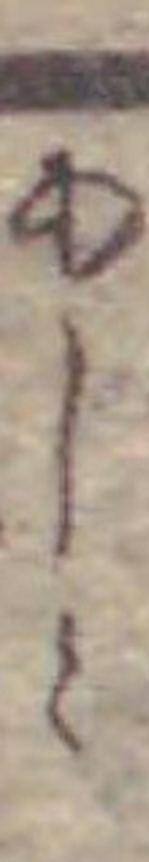あしと
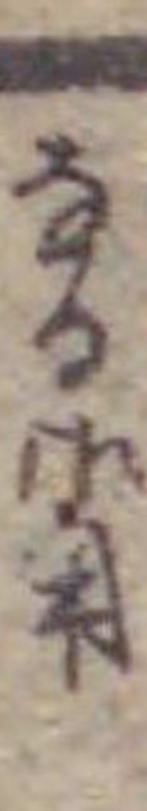なる御用
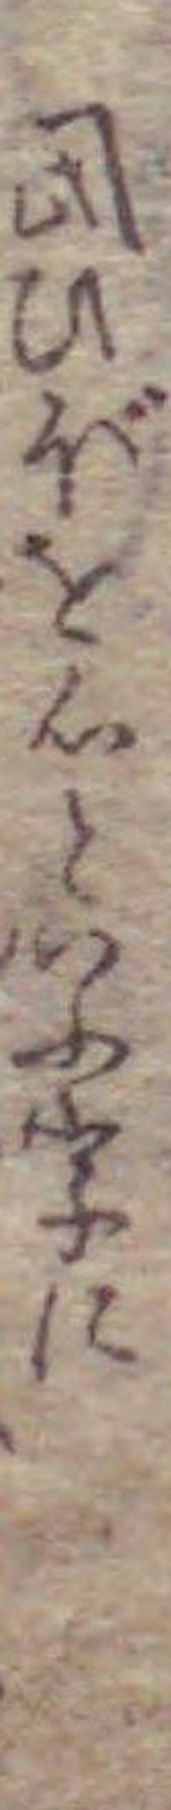〽此ひぼを心といふ字に
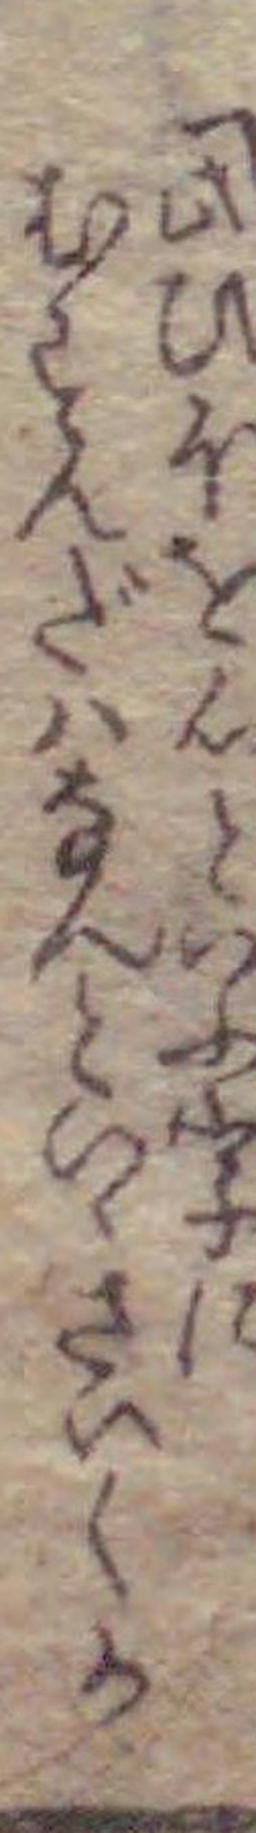むすんだはなんといゝさいくか
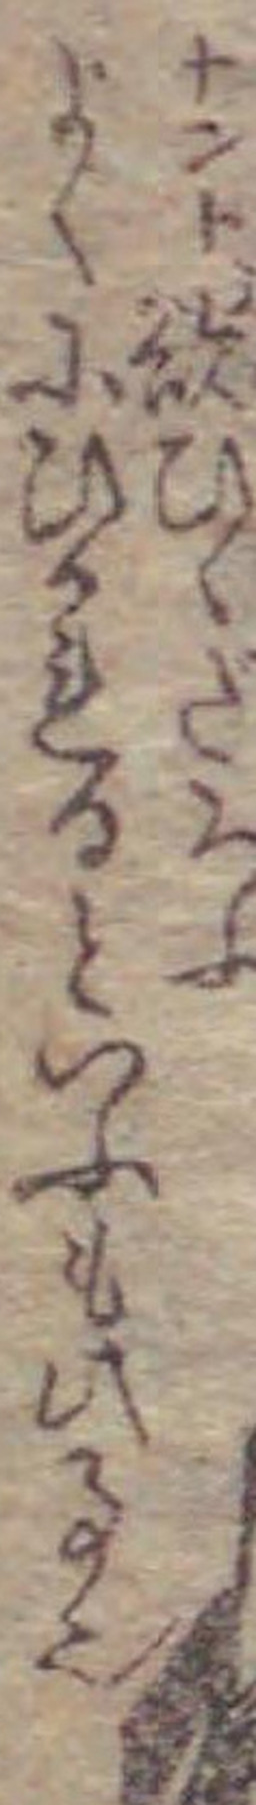よくにひかれるといふも此事也

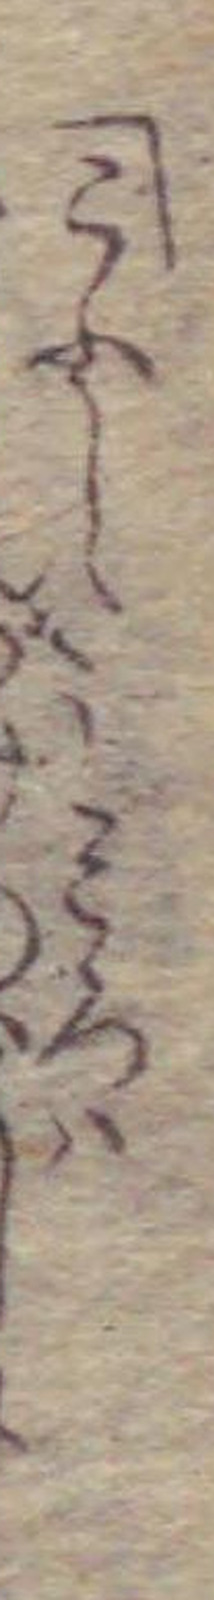〽こふしたところは
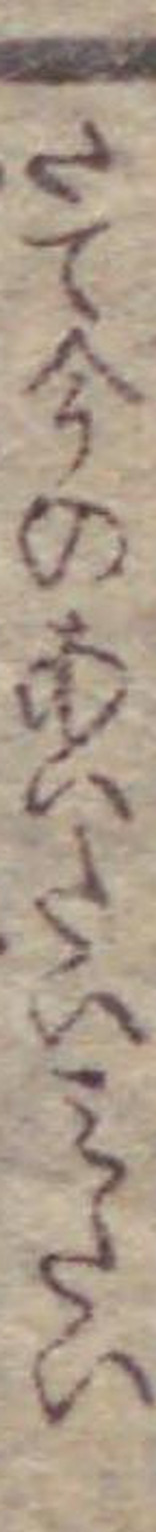たて今のあいたいみたい
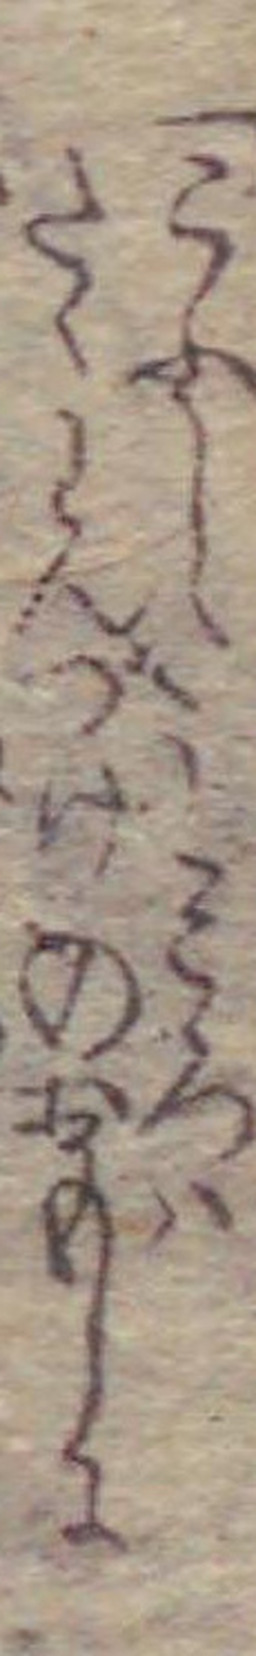たくわんづけのおもしに
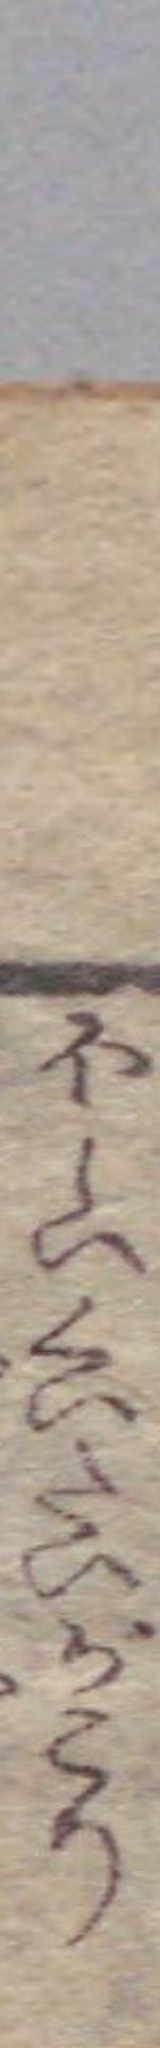ほしいくいたいがこり
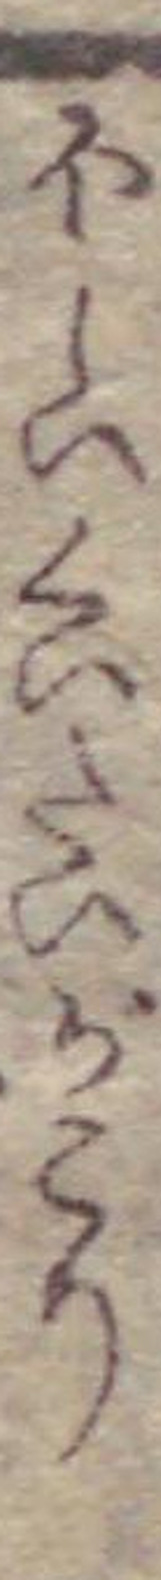ほしいくいたいがこり
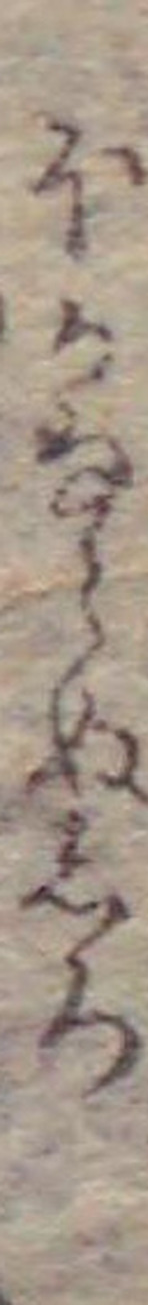ほかならぬしろ
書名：鼻下長生薬 : 3巻
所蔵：国立国会図書館 National Diet Library, JAPAN
